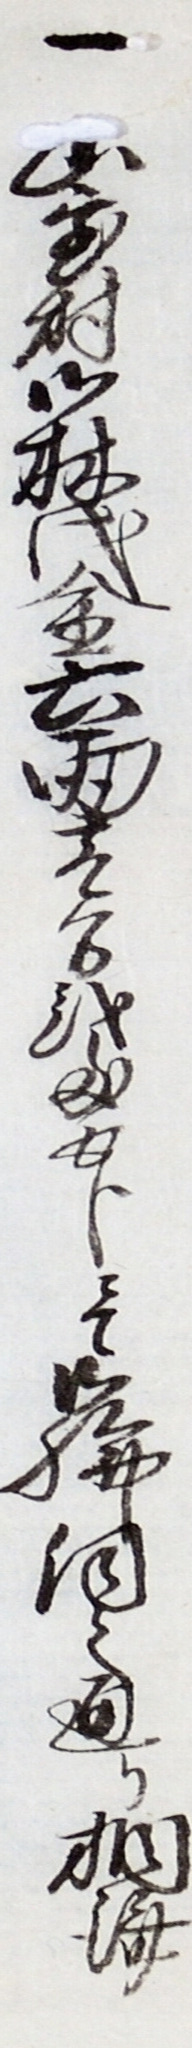一山室村御林代金六両壱方弐両五分ニて御払伺之通り相済
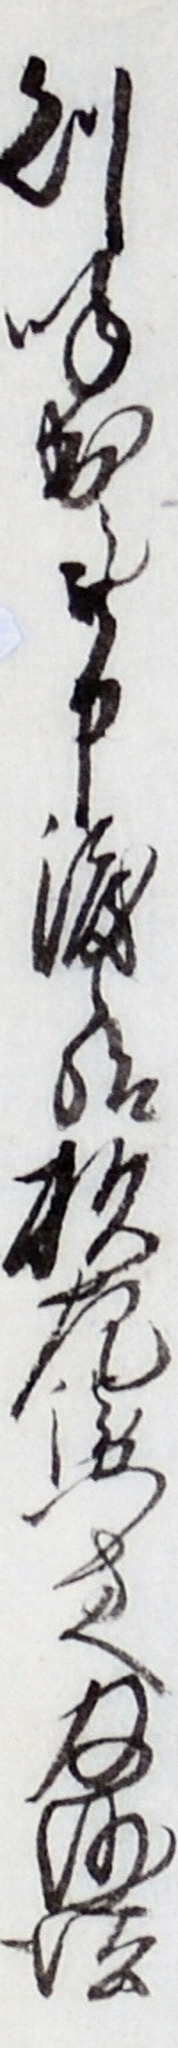則呼出し被申渡候様杉左衛門方へ及沙汰
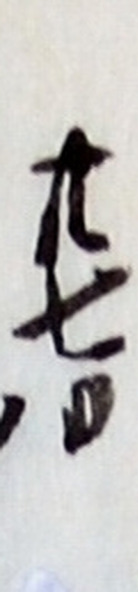廿七日
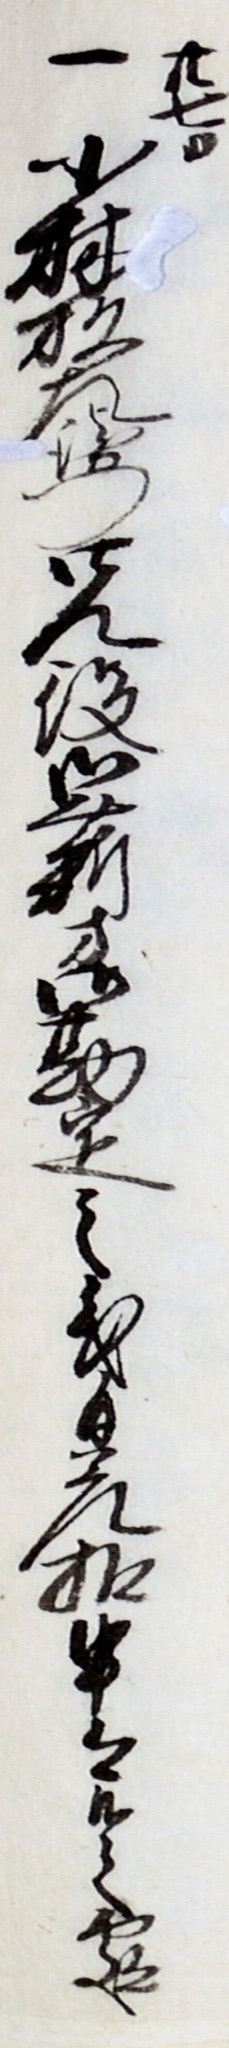一小林杉左衛門先役御薪方御勘定之義ニ付差扣申上候之処
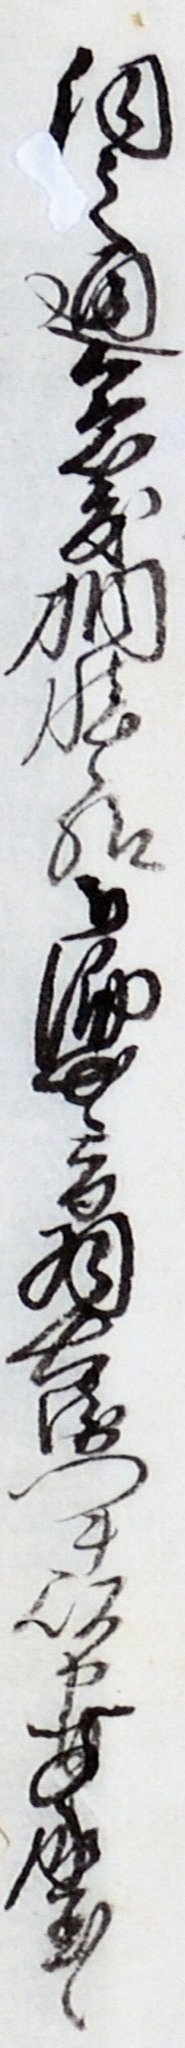調之通急度相請候様御払無候旨羽右衛門ヲ以申聞承置候
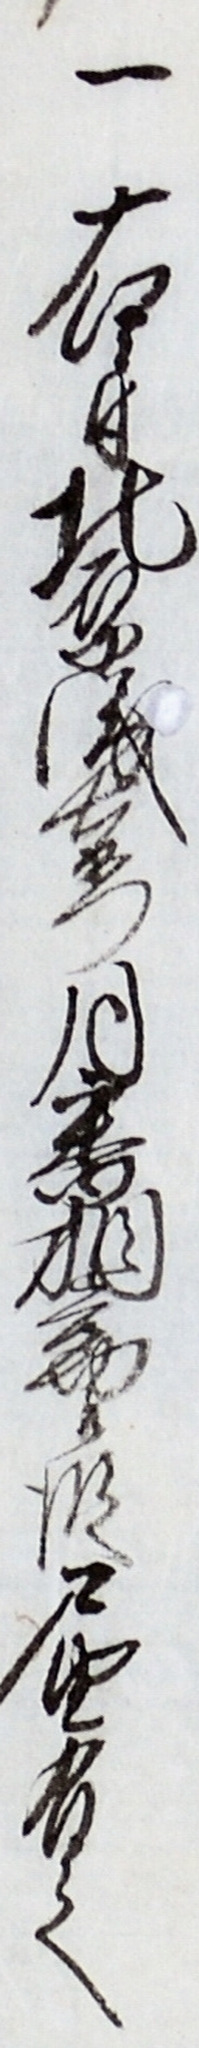一右ニ付北原儀右衛門月番相病候段届有之候
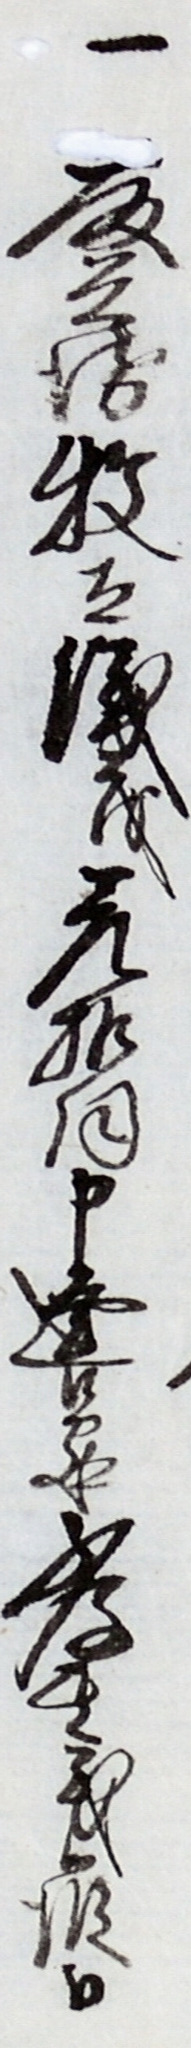一藤兵衛牧太儀も差扣伺申達候処不及ぶ義候段被
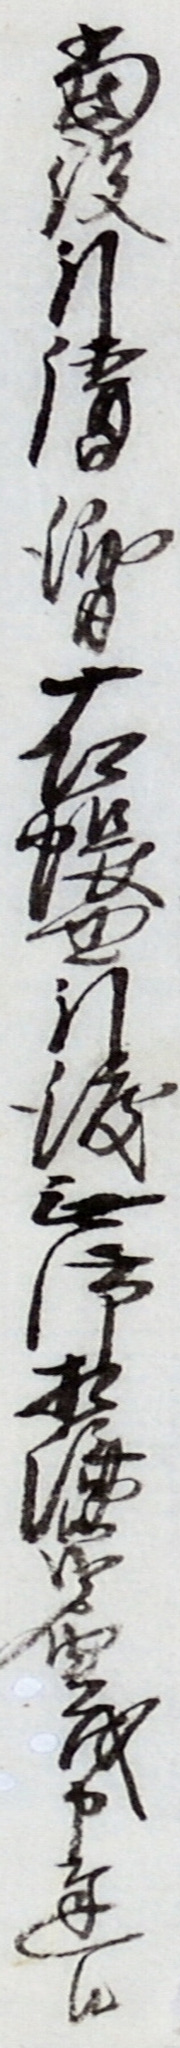当役引請日仰付右帳面引渡無滞相済御届も申達候
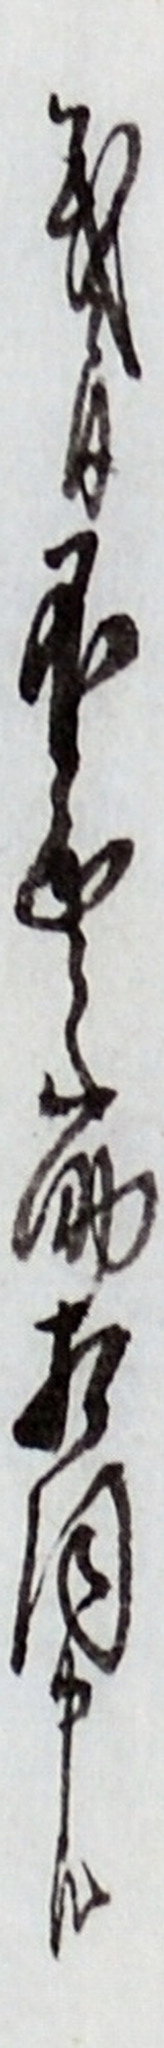義ニ付不意之筋相伺申候
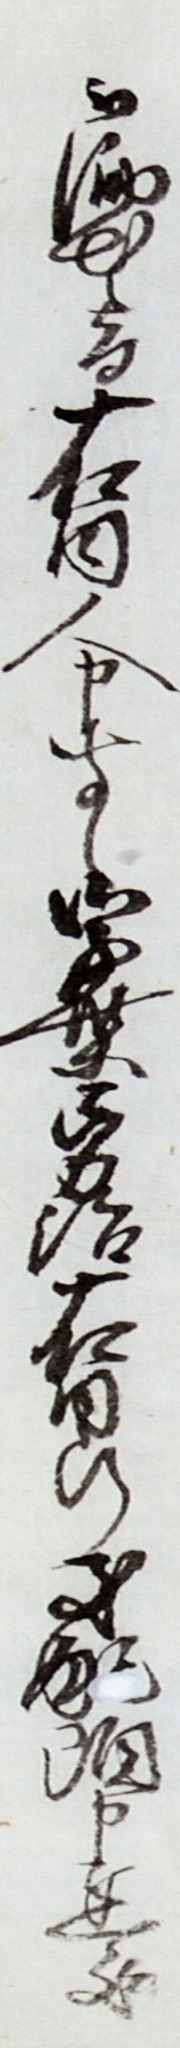被仰出候旨右同人申聞候御子柴勇治右同断支配調申達候処
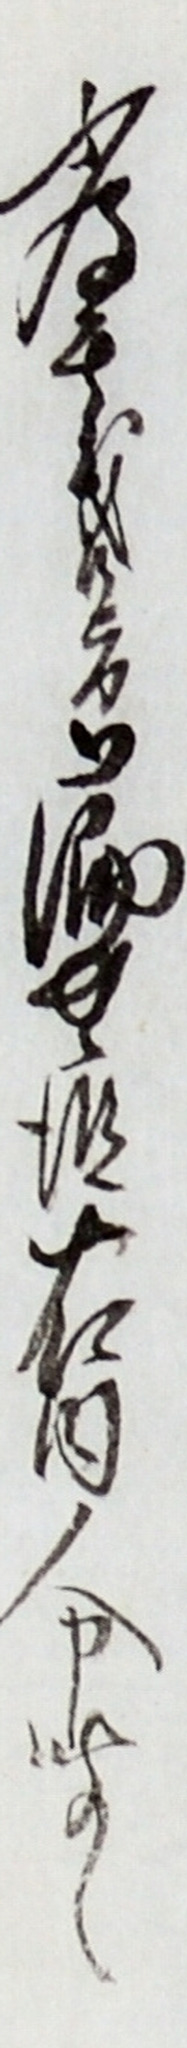不及其義候旨御済候段右同人申聞候

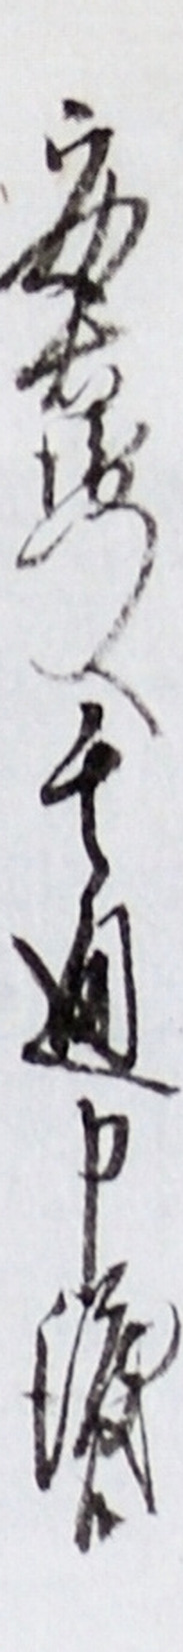安右衛門へ其通申渡候
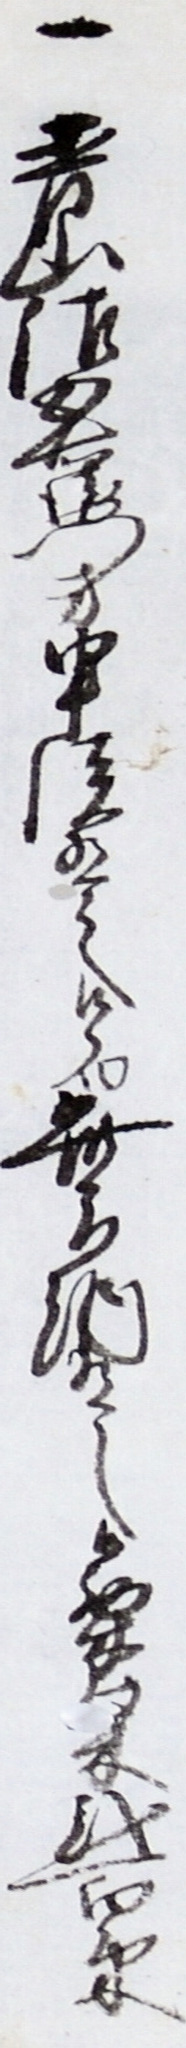一青山佐五右衛門方申談有之候も此上納有之候委曲木此百束
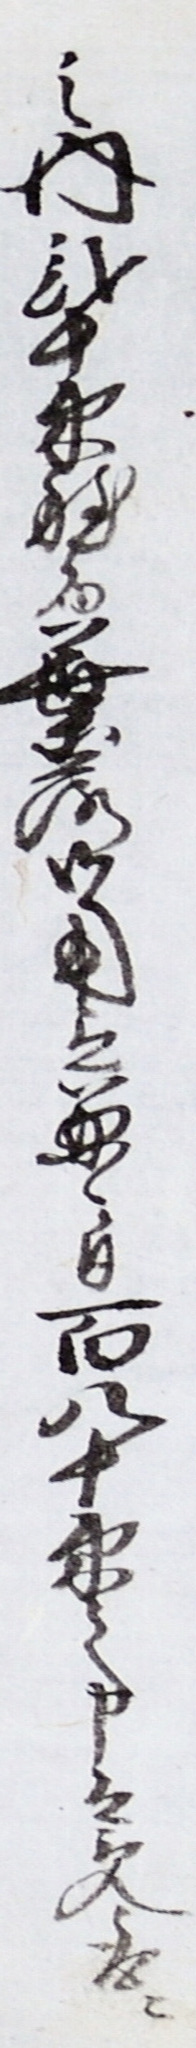之内弐十束程は無歩路御用立兼候に付百八十束々申立受取ニ
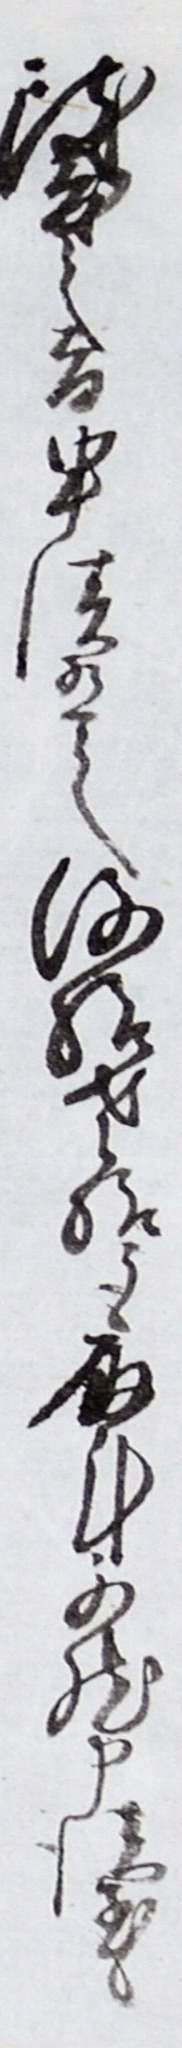致有之者申談有之候何左様ニも取計可然申談置候
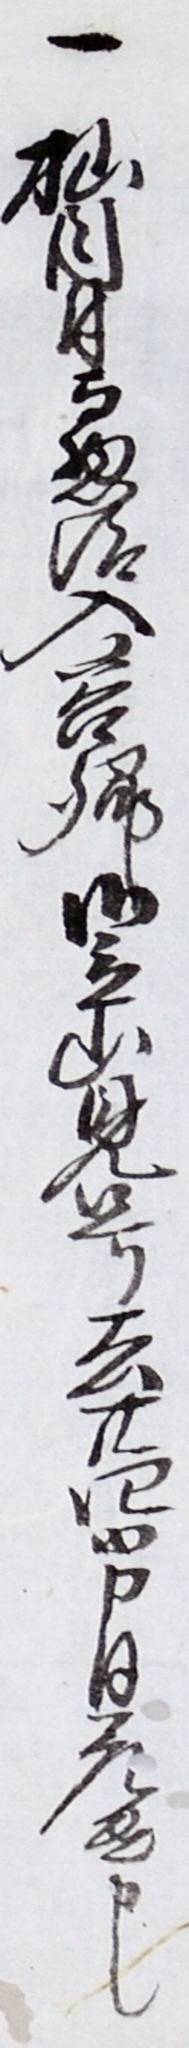一杣目付与惣治入ノ谷郷御立山見廻り去廿四日申月差替申候
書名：御山奉行御用控
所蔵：伊那市立高遠町図書館・合同会社AMANE
